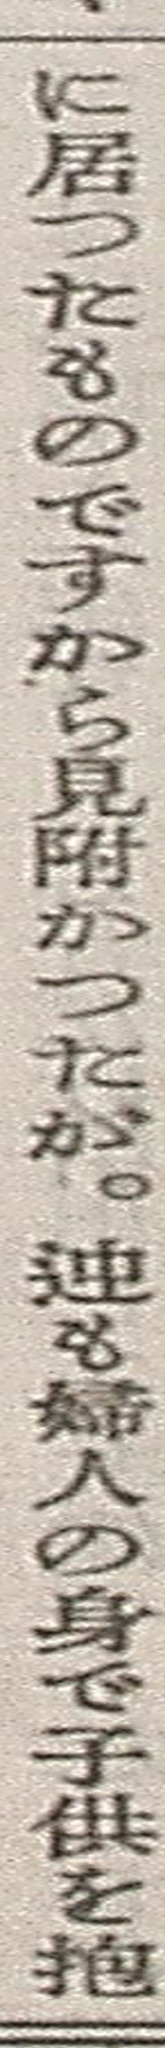に居つたものですから見附かつたが。迚も婦人の身で子供を抱
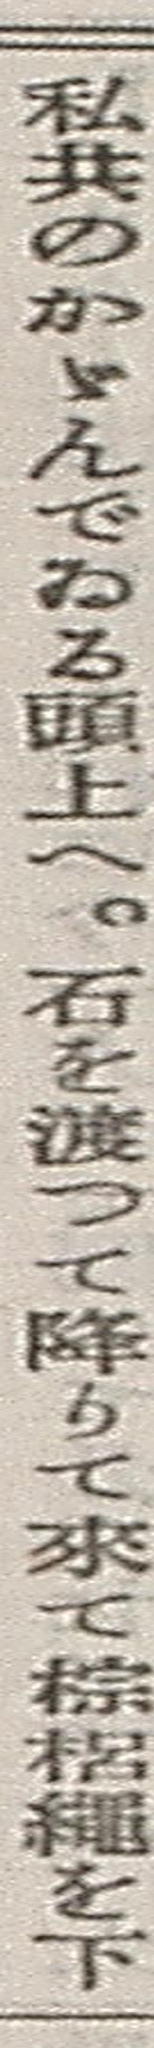私共のかゞんでゐる頭上へ。石を渡つて降りて来て棕梠縄を下
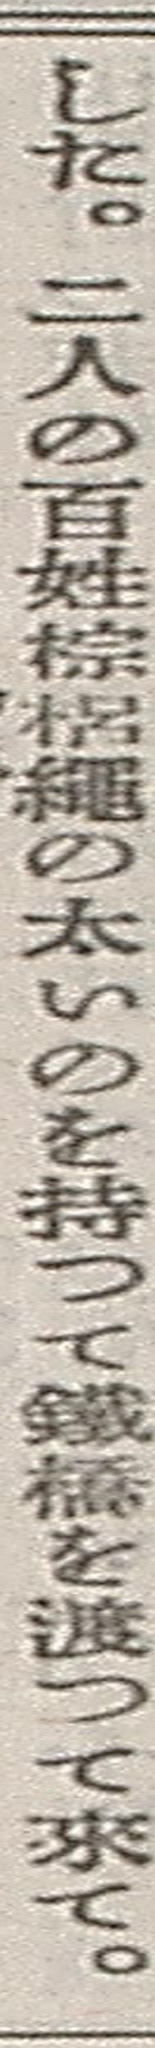した。二人の百姓棕梠縄の太いのを持つて鉄橋を渡つて来て。
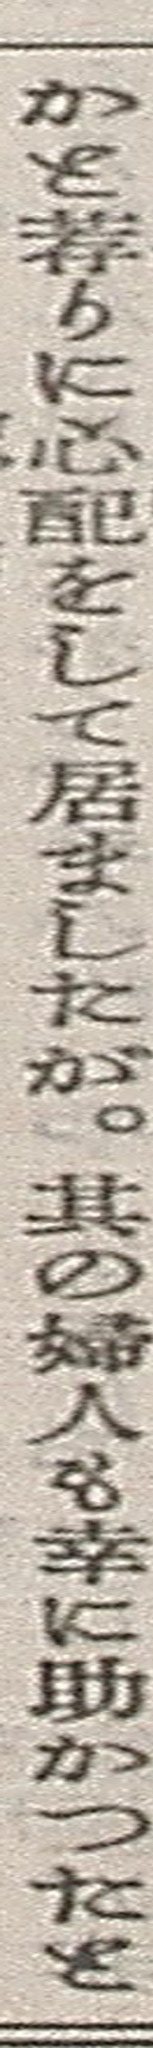かと荐りに心配をして居ましたが。其の婦人も幸に助かつたと
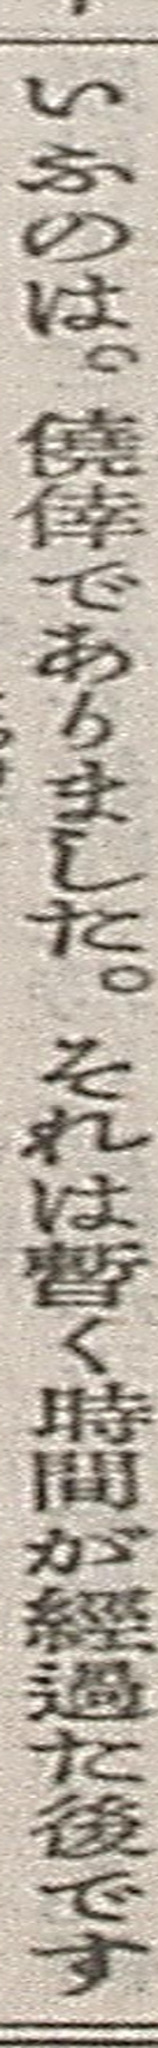いふのは。僥倖でありました。それは暫く時間が経過た後です
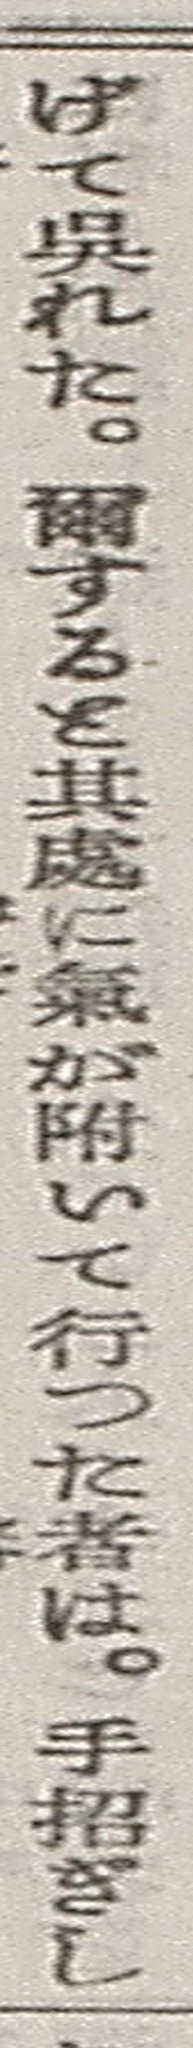げて呉れた。爾すると其処に気が附いて行つた者は。手招ぎし
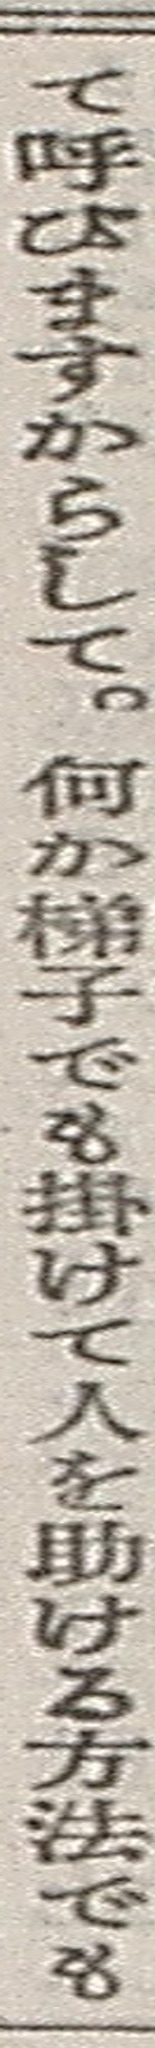て呼びますからして。何か梯子でも掛けて人を助ける方法でも
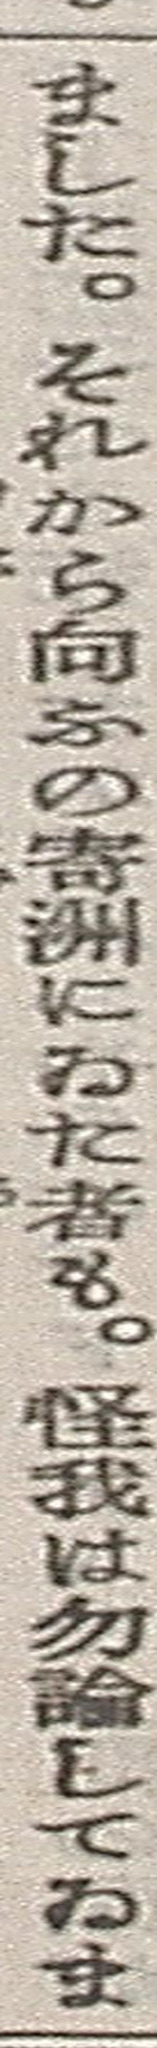ました。それから向ふの寄洲にゐた者も。怪我は勿論してゐま
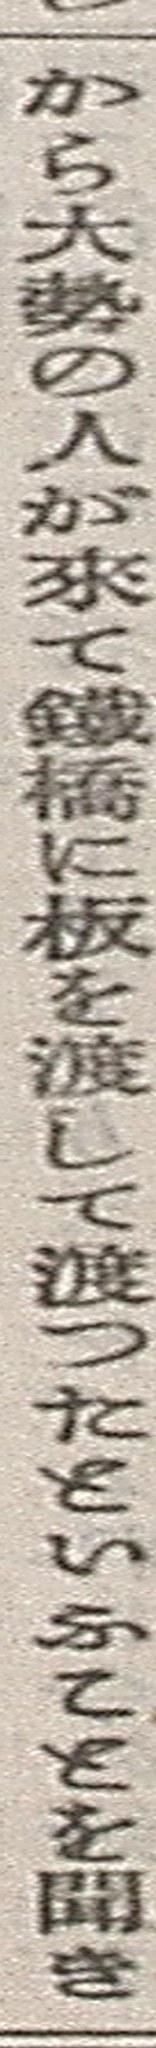から大勢の人が来て鉄橋に板を渡して渡つたといふことを聞き
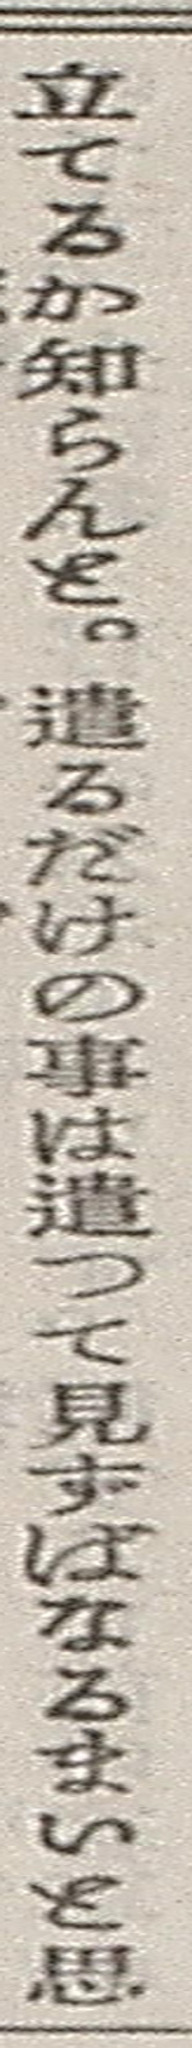立てるか知らんと。遣るだけの事は遣つて見ずばなるまいと思
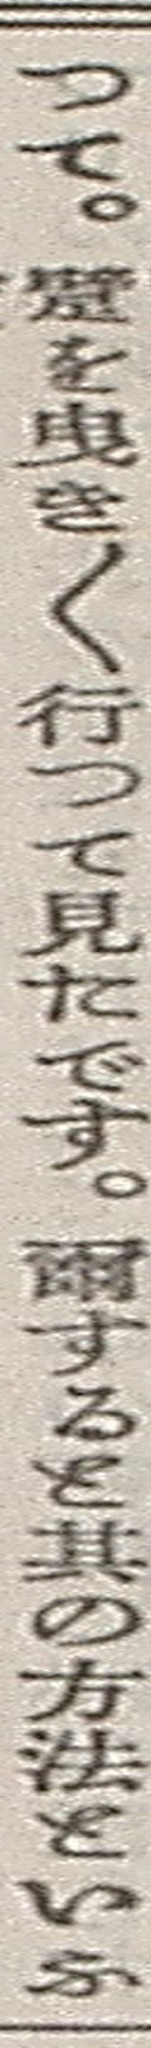つて。躄を曳き〳〵行つて見たです。爾すると其の方法といふ
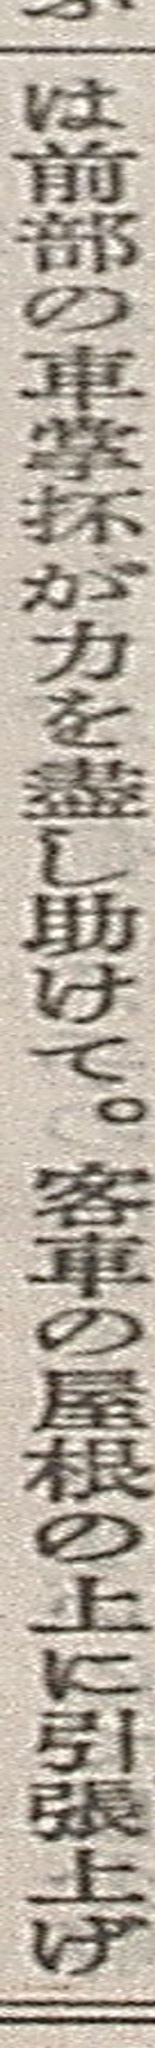は前部の車掌抔が力を尽し助けて。客車の屋根の上に引張上げ
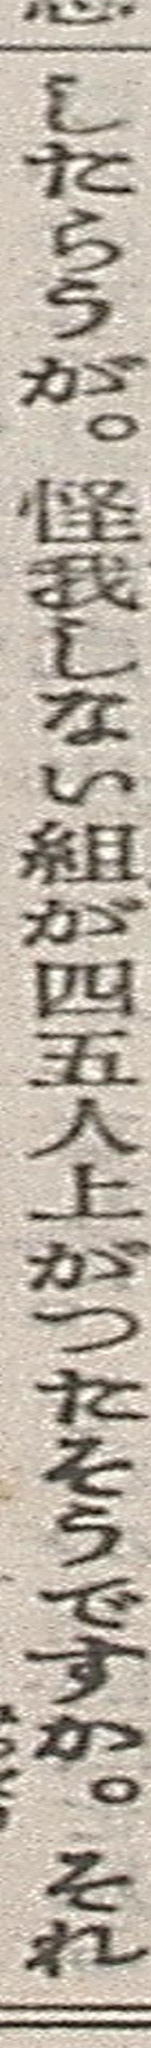したらうが。怪我しない組が四五人上がつたそうですか。それ
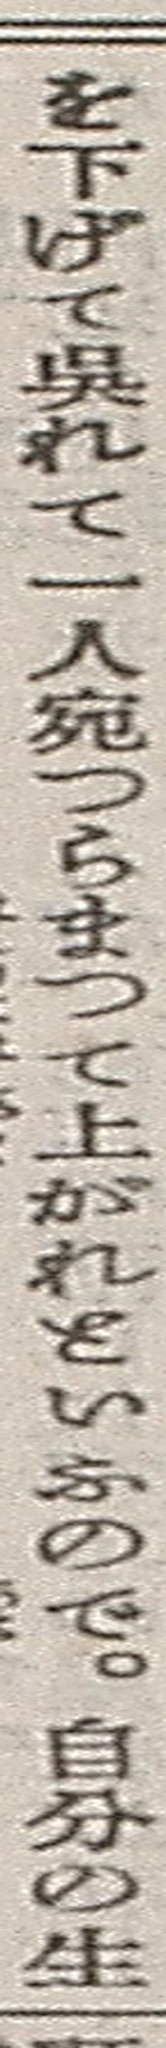げて呉れて一人宛つらまつて上がれといふので。自分の生
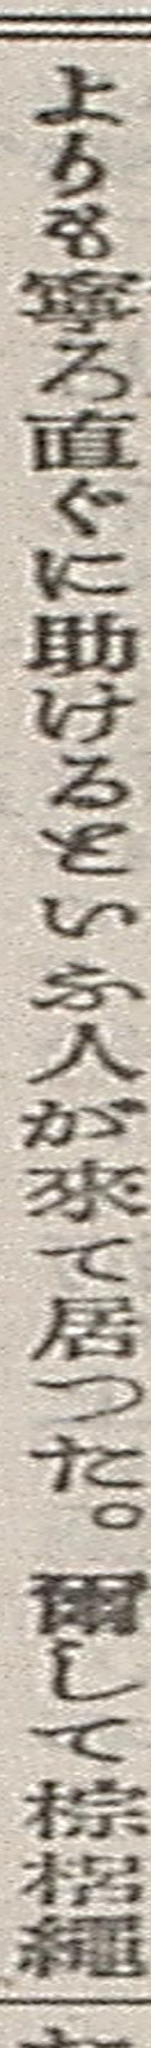よりも寧ろ直ぐに助けるといふ人が来て居つた。爾して棕梠縄を下
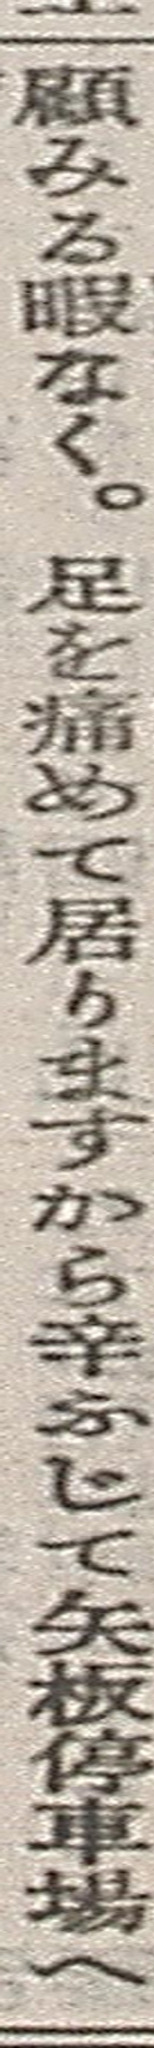顧みる暇なく。足を痛めて居りますから辛ふじて矢板停車場へ
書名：風俗畫報臨時増刊第百九十九號　明治三十二年十月各地災害圖會（前編之續）
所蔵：東京大学地震研究所図書室 Earthquake Research Institute Library, The University of Tokyo, JAPAN
